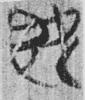既
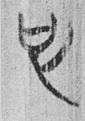只（躋）
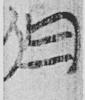於
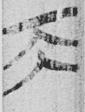天
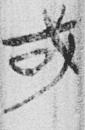或（又）
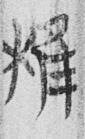椎（墜）
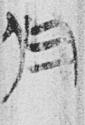於
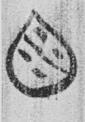囦（淵）
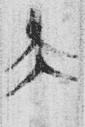夫
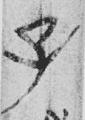子
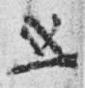之
